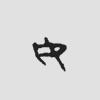女
